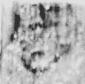周
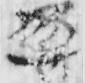惕
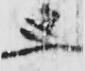之
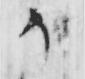人
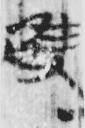○（雘）
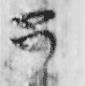邑
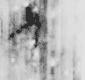人
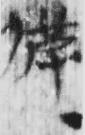佊
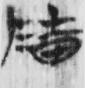○（隋）
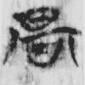晨
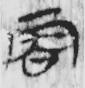丙
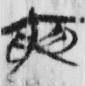寅
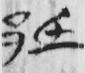邸
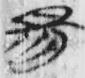昜（陽）
